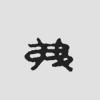弗
